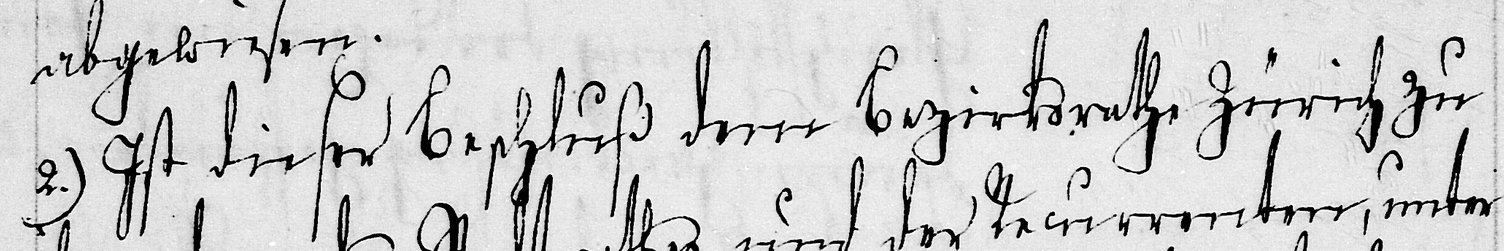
2.) Ist dieser Beschluß dem Bezirksrathe Zürich zu
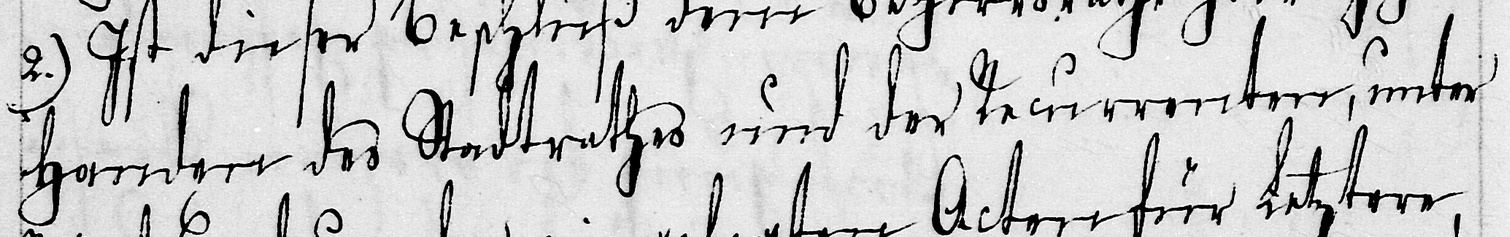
Handen des Stadtrathes und der Recurrenten, unter
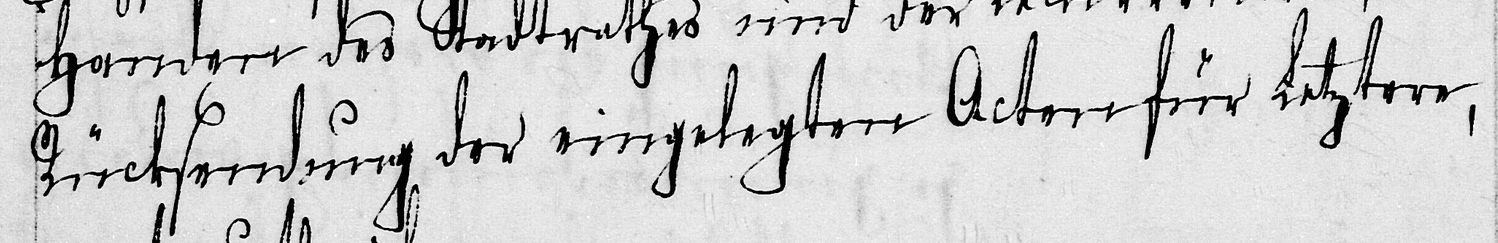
Rücksendung der eingelegten Acten für Letztere,
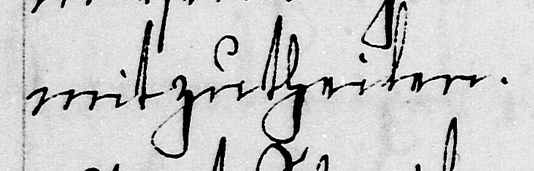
mitzutheilen.
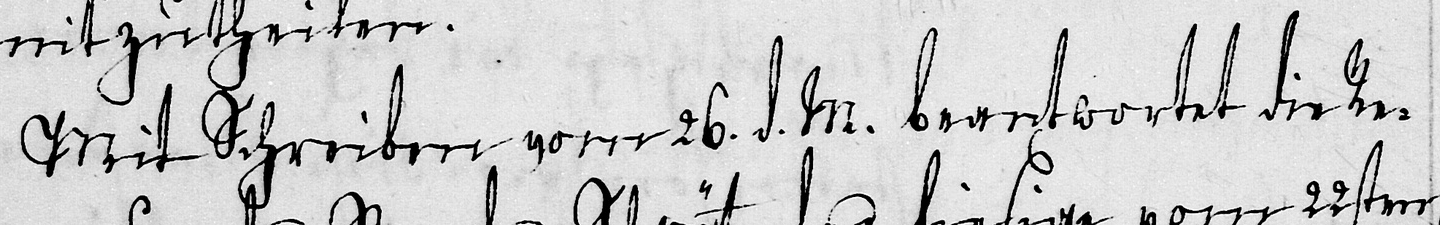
Mit Schreiben vom 26. d. M. beantwortet die Re¬
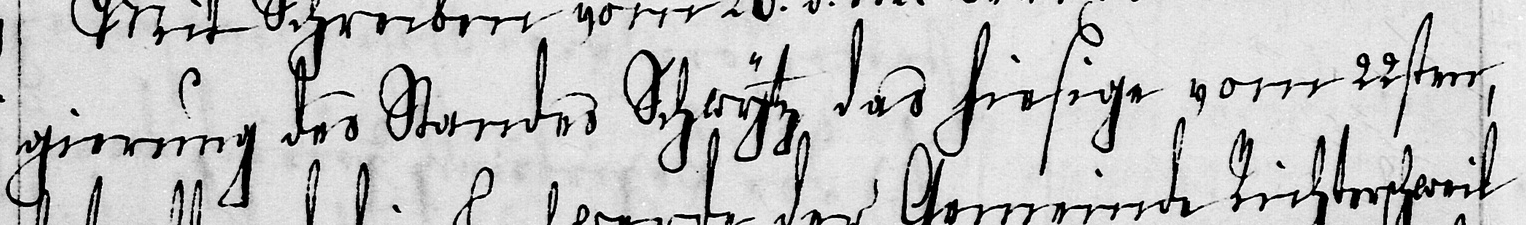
gierung des Standes Schwytz das hiesige vom 22sten,
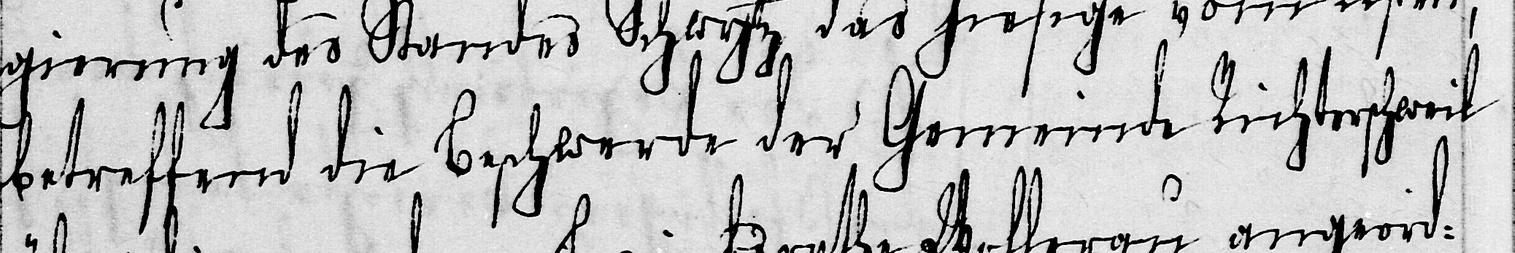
betreffend die Beschwerde der Gemeinde Richterschweil
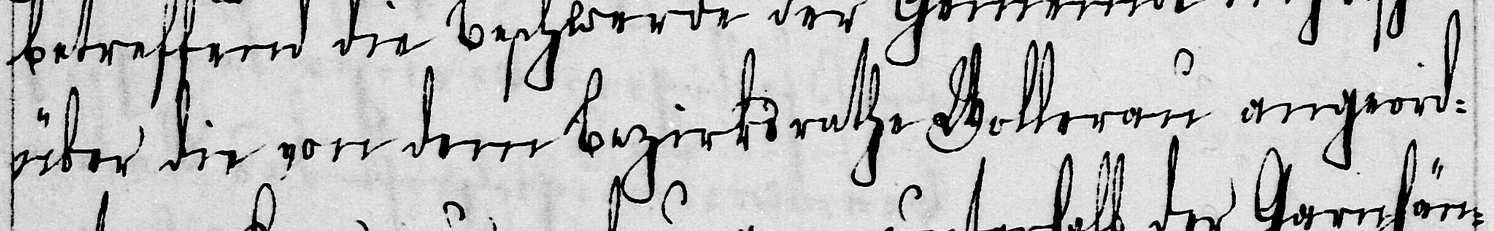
über die von dem Bezirksrathe Wollerau angeord¬
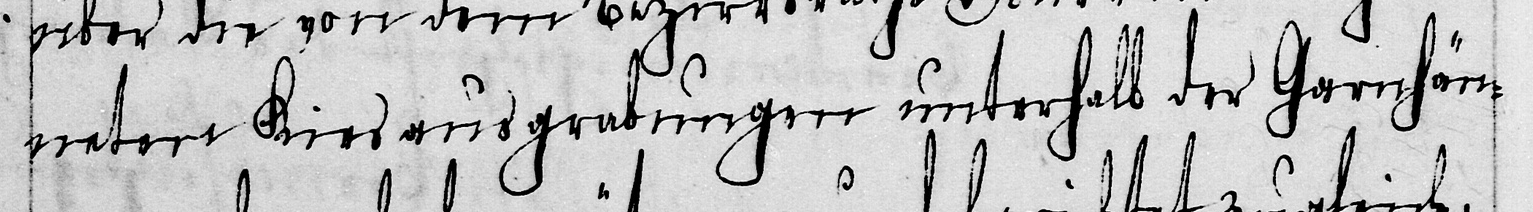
neten Kiesausgrabungen unterhalb der Garnhän¬
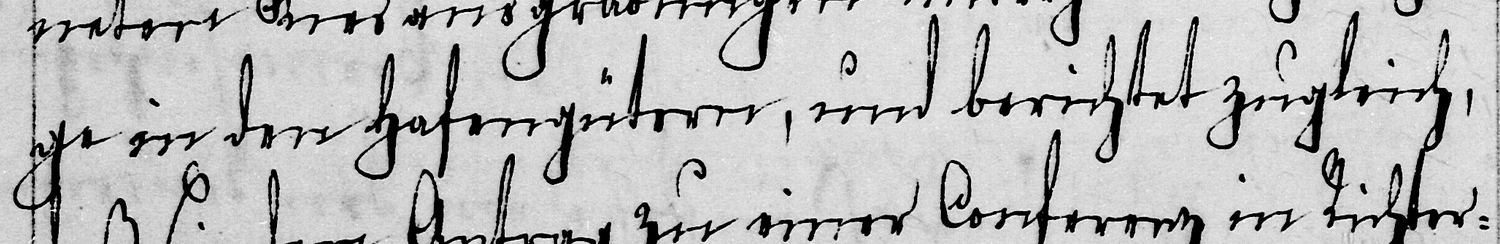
ge in den Hafengütern, und berichtet zugleich,
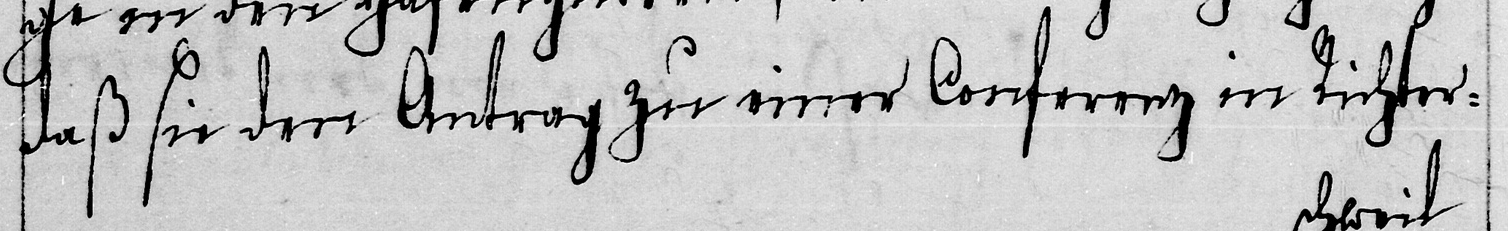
daß sie den Antrag zu einer Conferenz in Richter-
